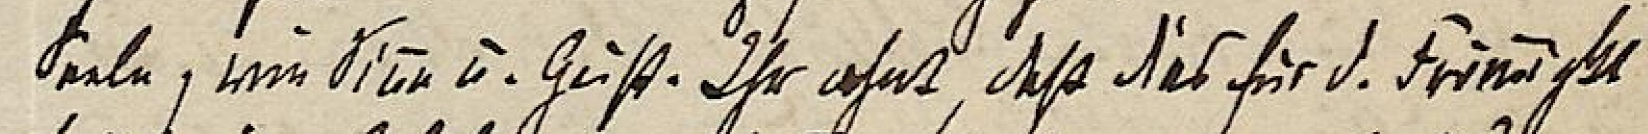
Seele, wie Sine und Geist. Ihr ahnt, daß dies für d. Frömigkt
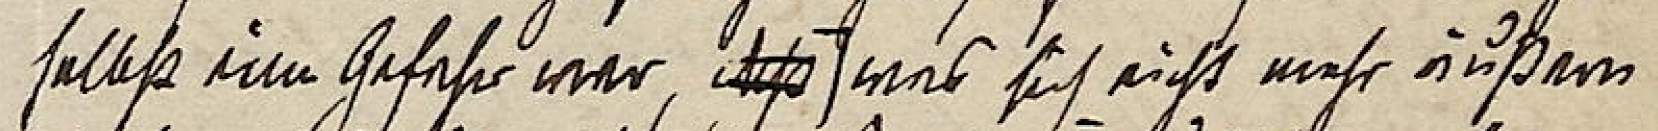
selbst eine Gefahr war, daß was sich nicht mehr äußern
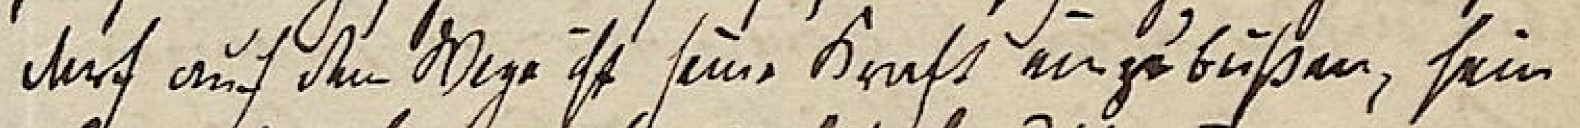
darf auf dem Wege ist seine Kraft einzubüßen, sein
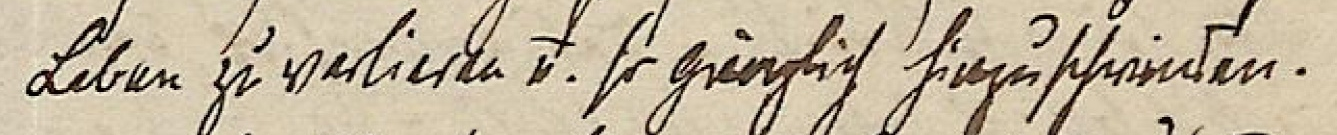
Leben zu verlieren u. sr. gänzlich hinzuschwinden.
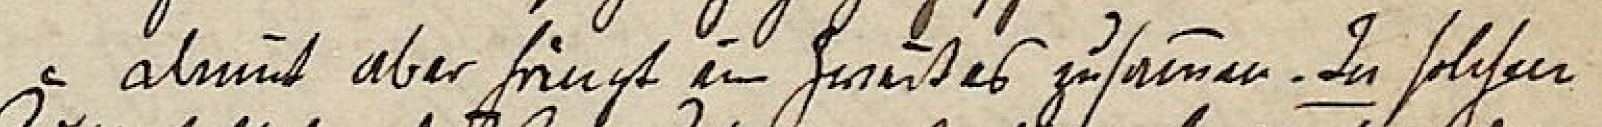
Damit aber hängt ein Zweites zusamen. In solchen
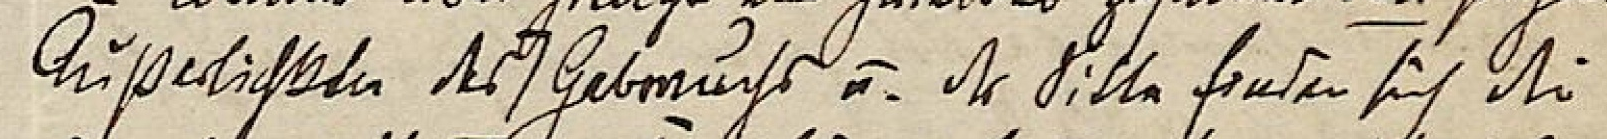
Äußerlichktn. des ] Gebrauchs u. der Sitte finden sich die
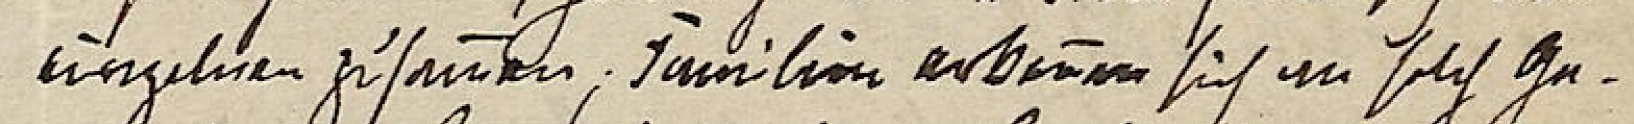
einzelnen zusamen, Familien erkenen sich an solch Ge¬
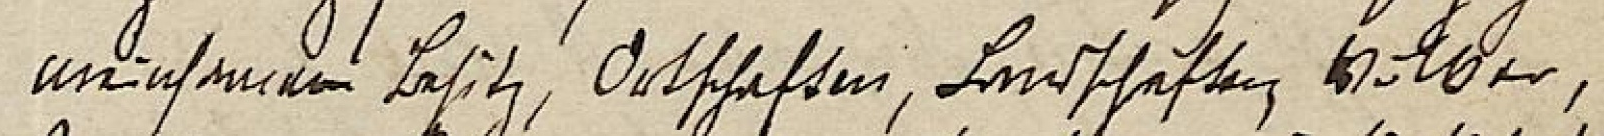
meinsamem Besitz, Ortschaften, Landschaften, Völker,
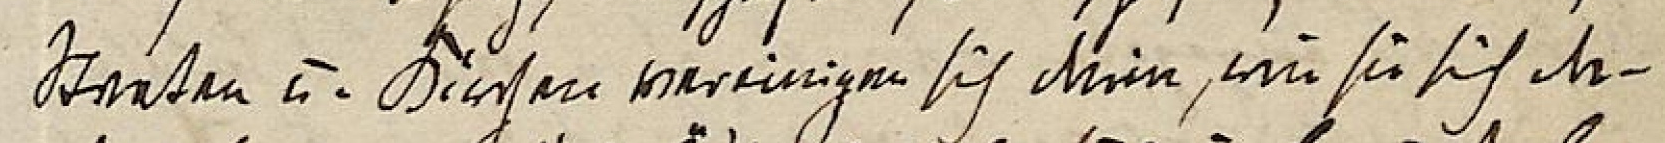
Staaten u. Kirchen vereinigen sich darin, wie sie sich da¬
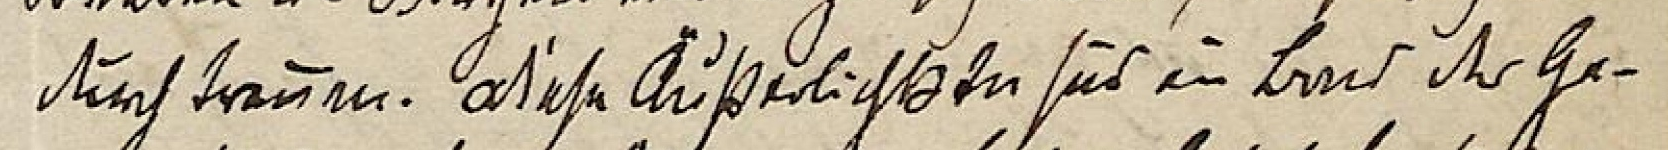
durch trenen. Diese Äußerlichktn sind ein Band der Ge¬
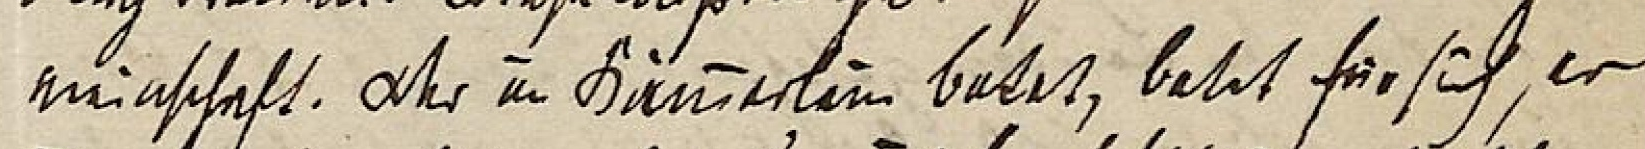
meinschaft. Wer im Kämerlein betet, betet für sich, er
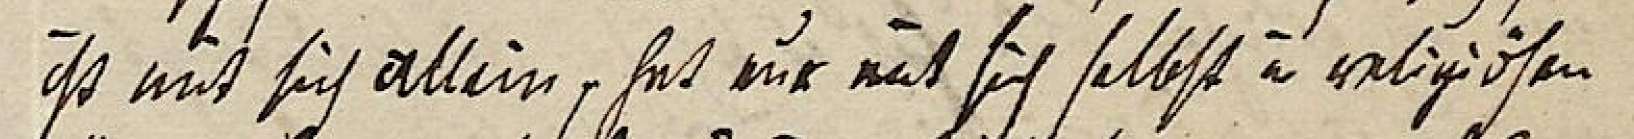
ist mit sich allein, hat nur mit sich selbst in religiösen
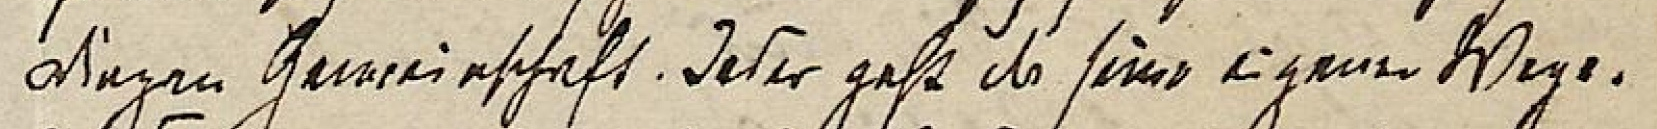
Dingen Gemeinschaft. Jeder geht da seiner eigenen Wege.
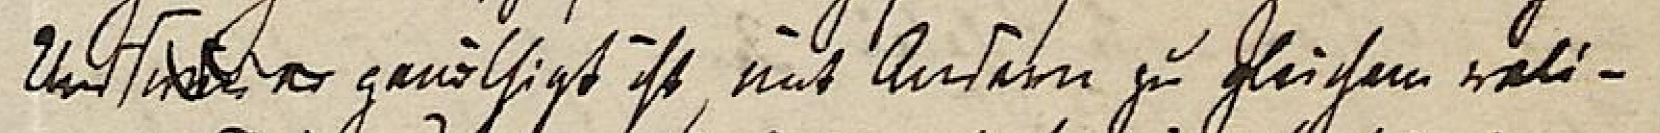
Und [ wie er genöthigt ist, mit Andern zu gleichem reli¬
